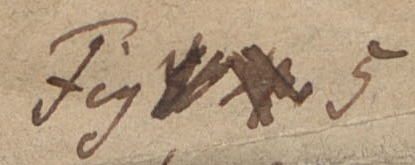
Fig 5 4 5
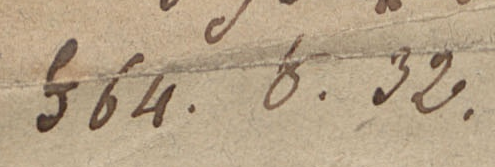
§ 64. S. 32.
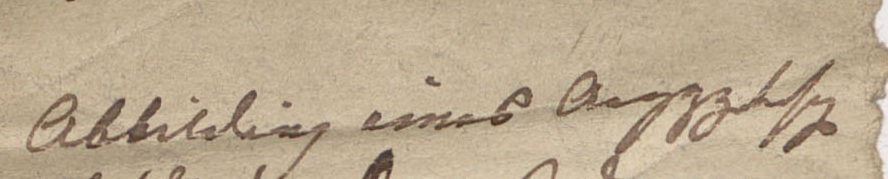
Abbildung eines Aegyptisch
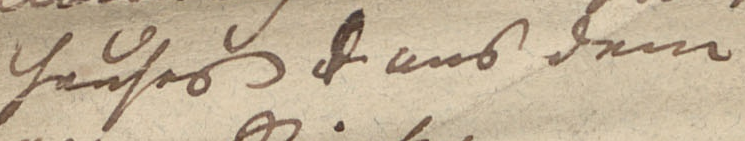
Hauses d aus dem
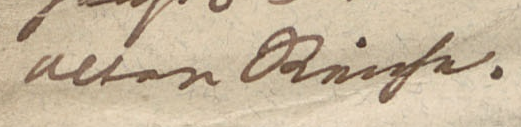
alten Reiche.
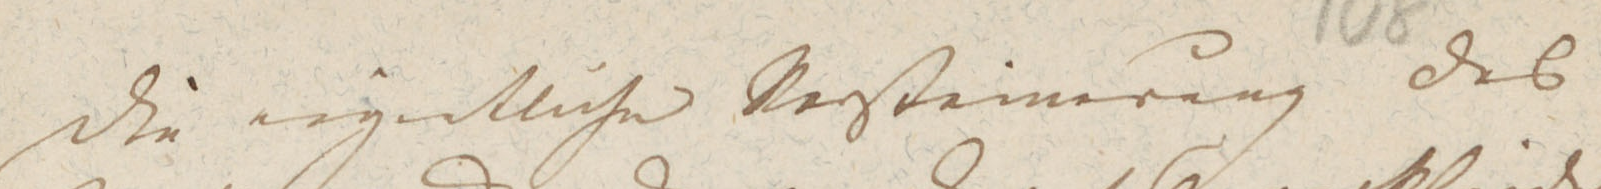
Die eigentliche Versteinerung des
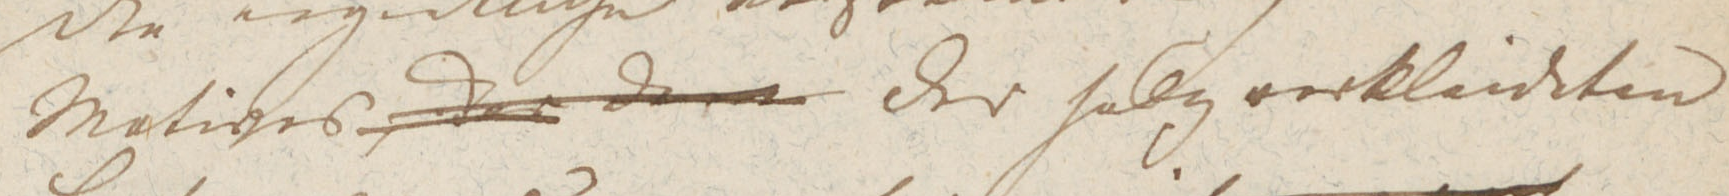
Motives, das dem der holz verkleideten
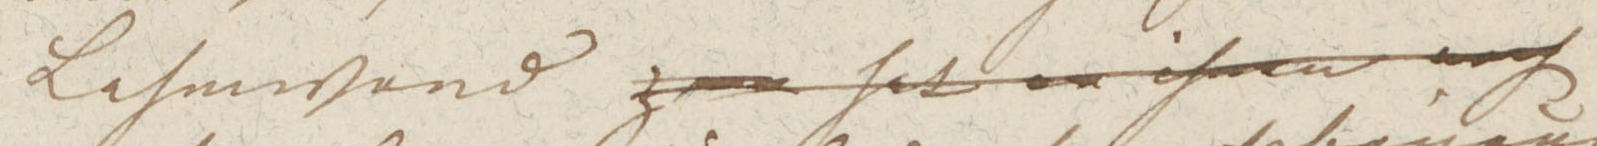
Lehmwand z hat an ihnen noch
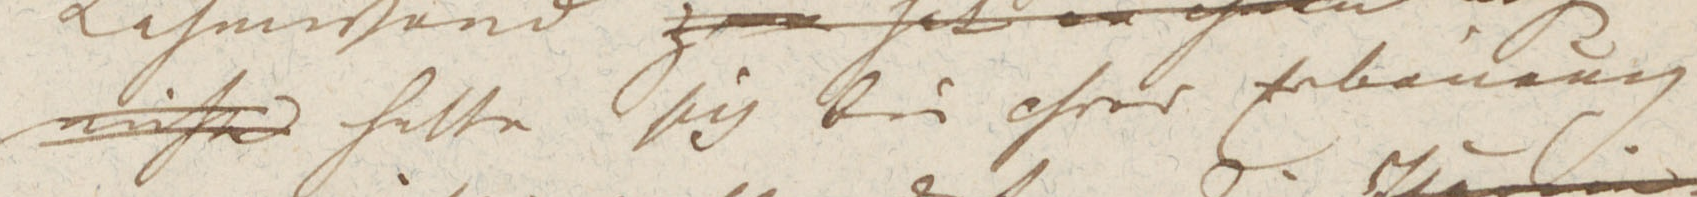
nicht hatte sich bei ihrer Erbaunug
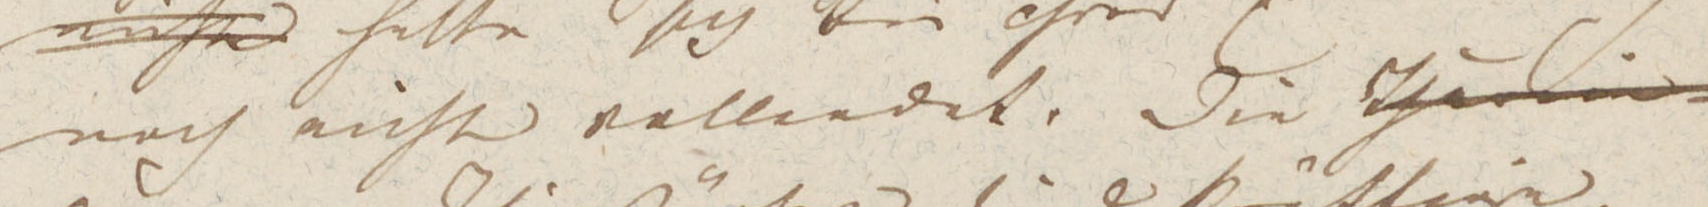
noch nicht vollendet. Die Thürein-
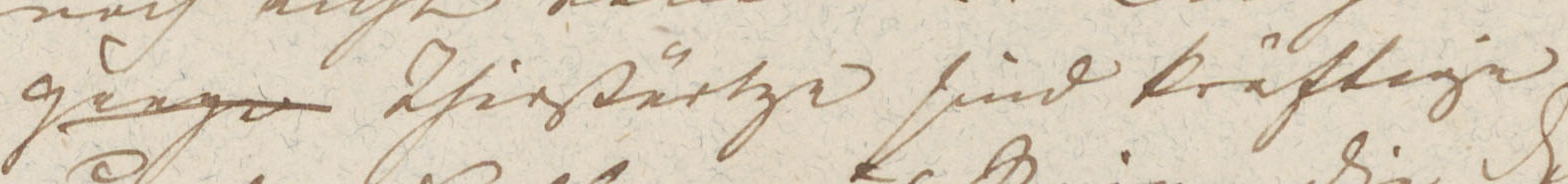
gange Thürstürtze sind kräftige
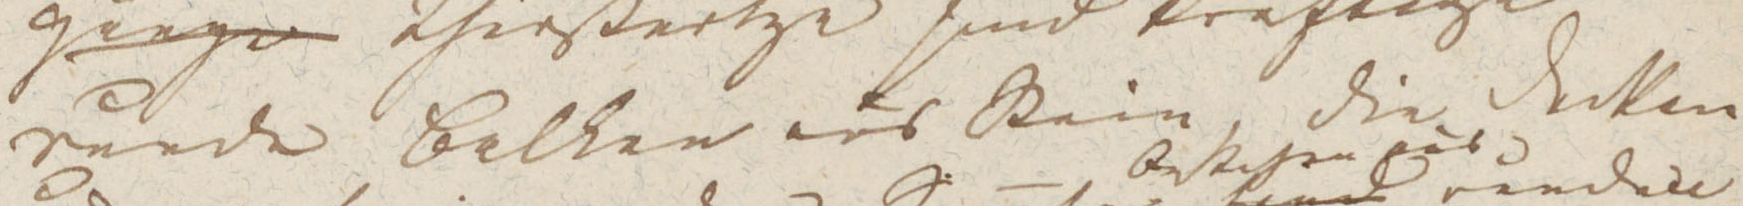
runde Balken aus Stein, die Decken
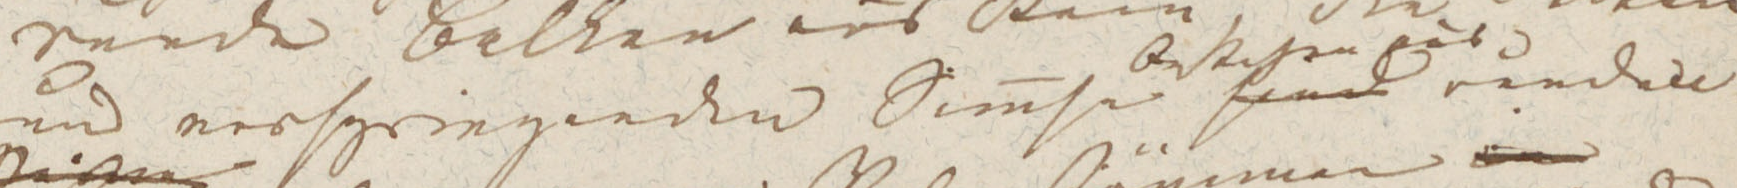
und vorspringenden Simmse sind bestehen aus runden
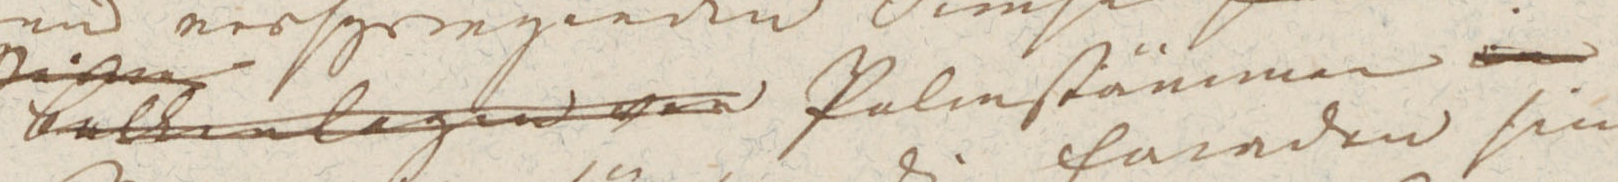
Balkenlagen von Palmstämmen in
